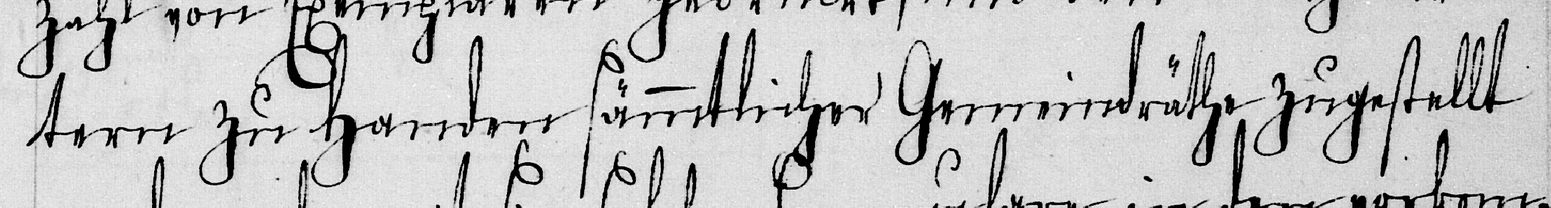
tern zu Handen sämmtlicher Gemeindräthe zugestellt
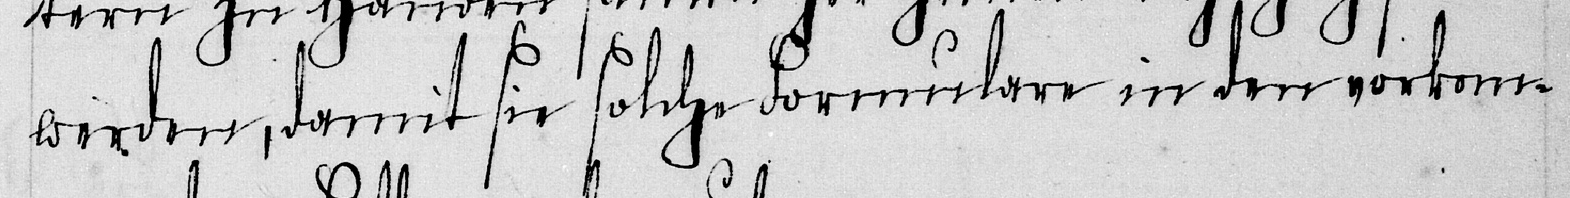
werden, damit sie solche Formulare in den vorkom¬
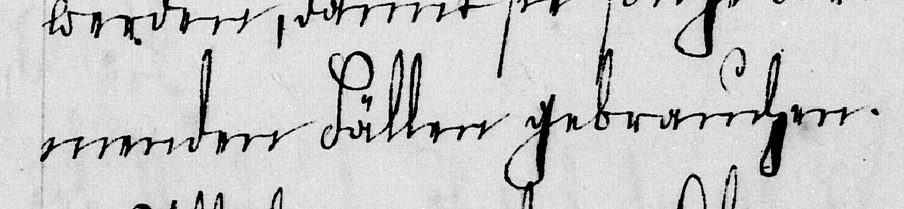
menden Fällen gebrauchen.
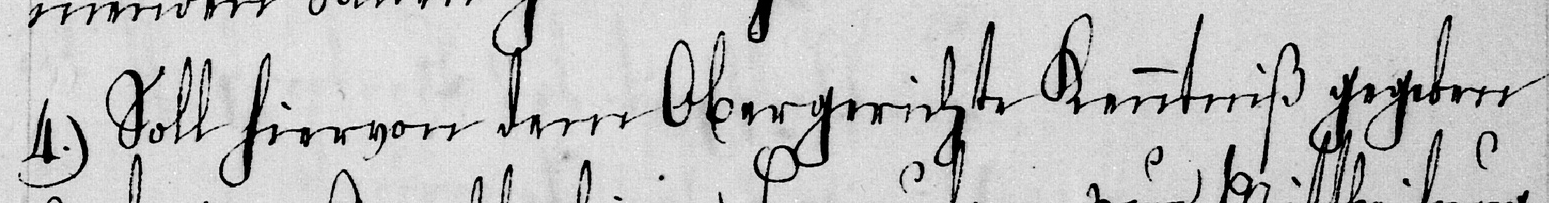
4.) Soll hiervon dem Obergerichte Kenntniß gegeben
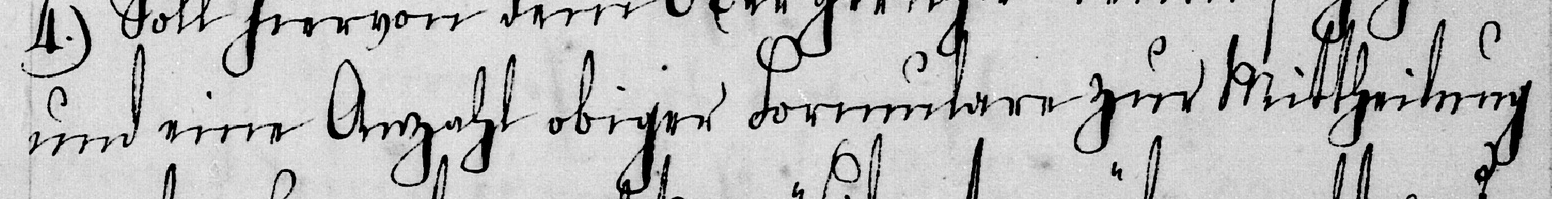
und eine Anzahl obiger Formulare zur Mittheilung
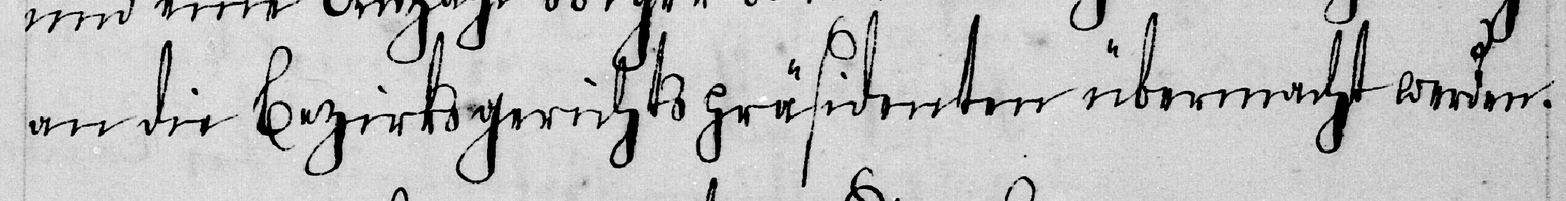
an die Bezirksgerichtspräsidenten übermacht werden.
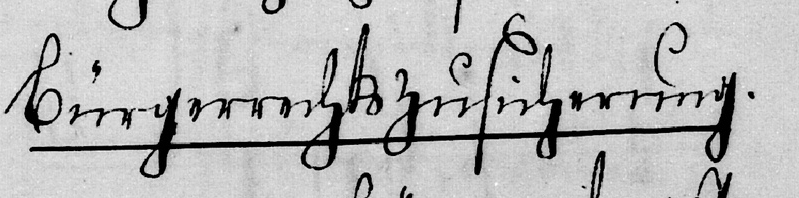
Bürgerrechtszusicherung
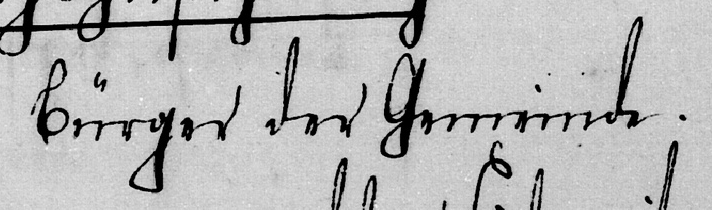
…Bürger der Gemeinde
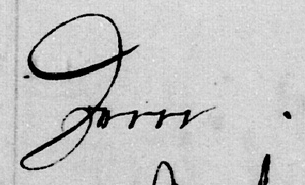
…
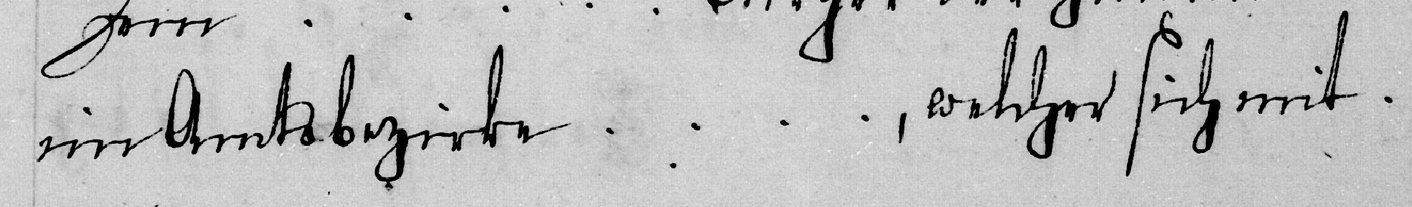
im Amtsbezirke …, welcher sich mit
